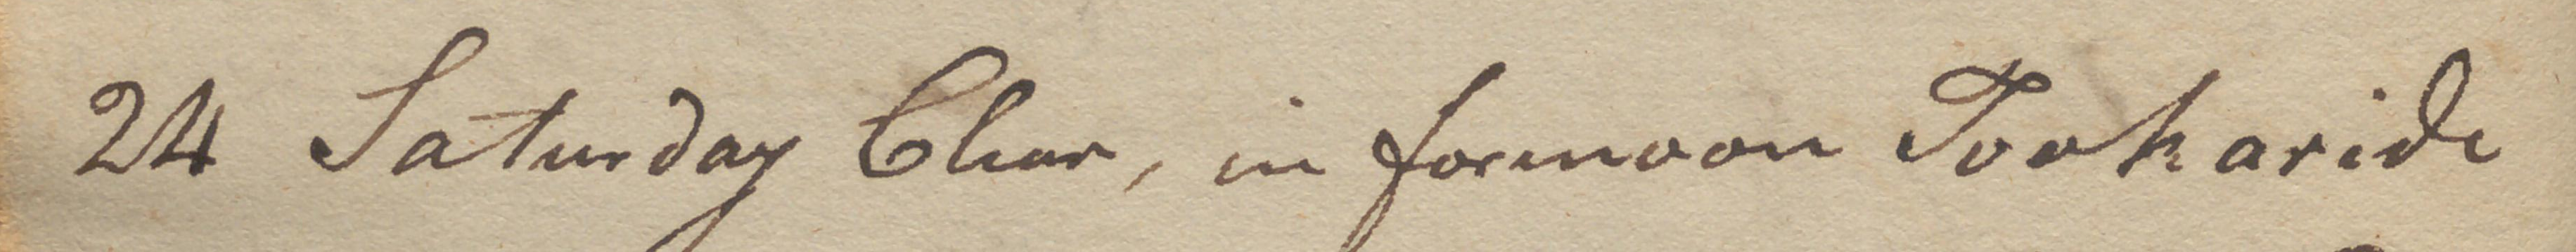24 Saturday Clear, in foreoon Took a ride
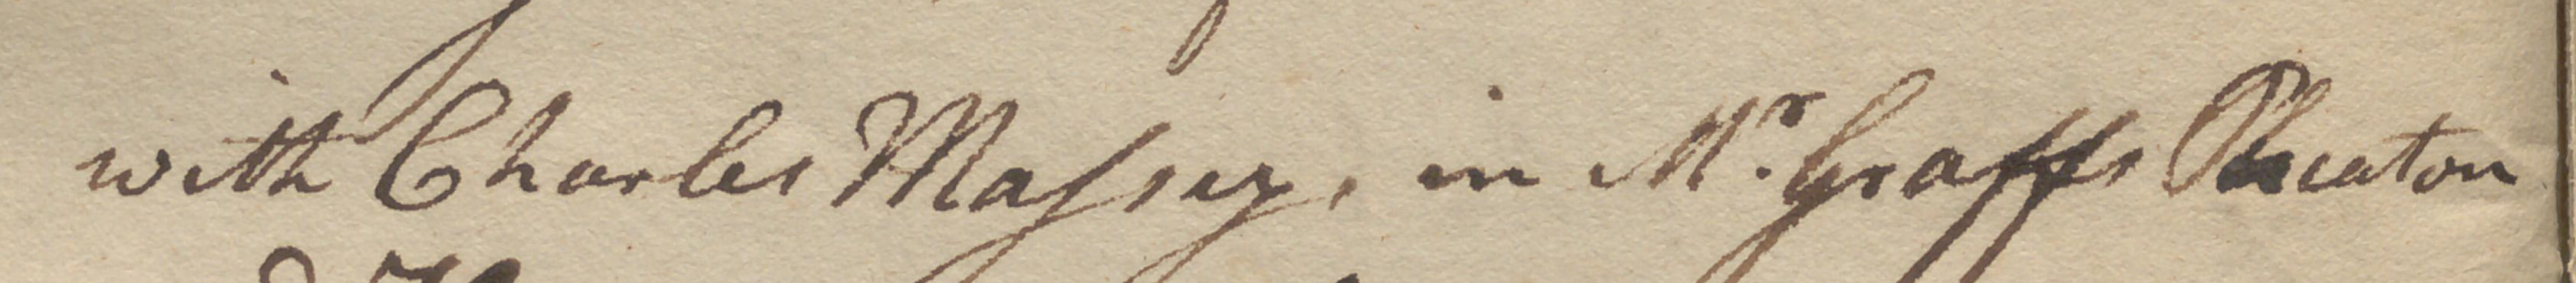with Charles Massey, in M^r. Graffs Pheaton
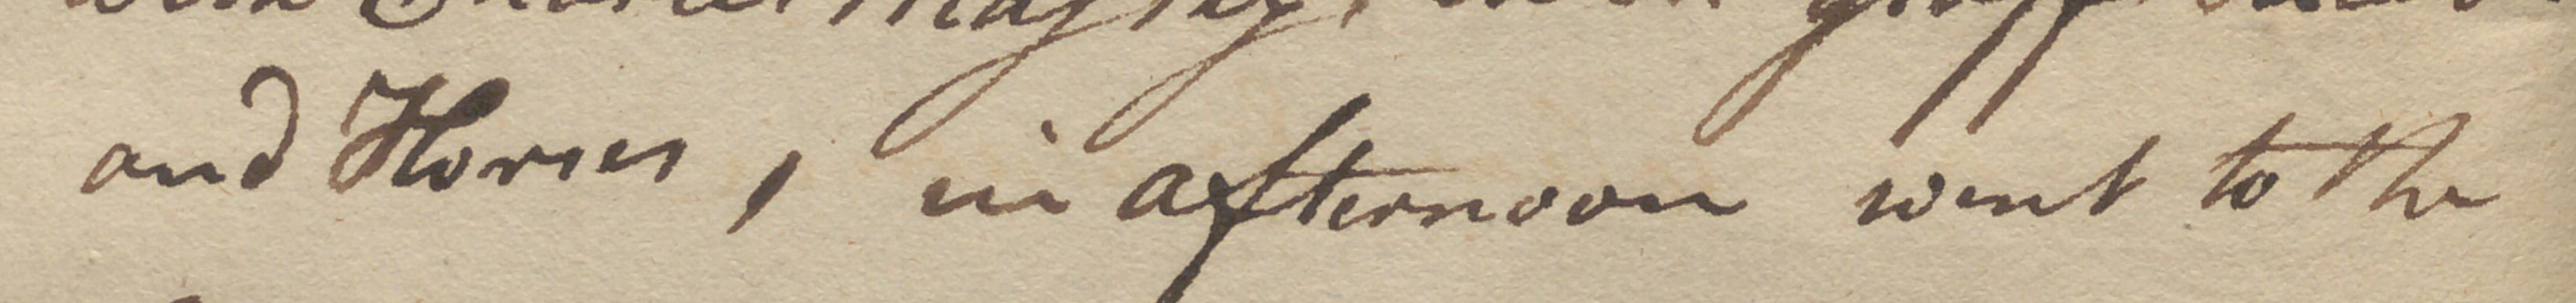and Horses, in afternoon went to the
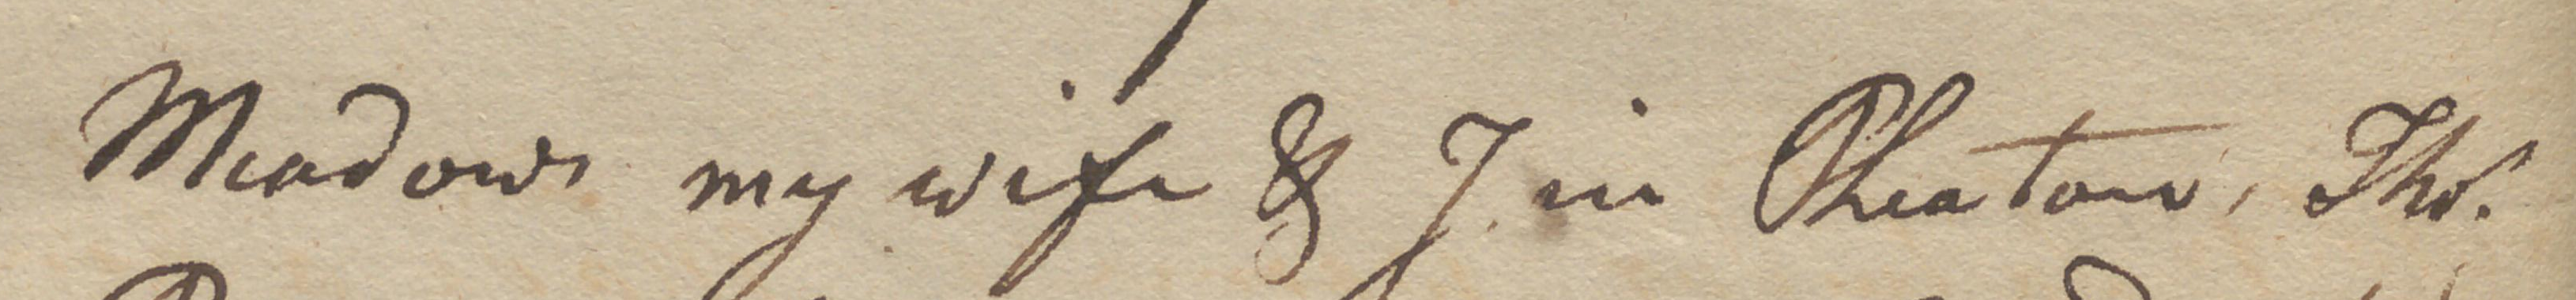Meadows my wife & I in Pheaton, Tho^s.
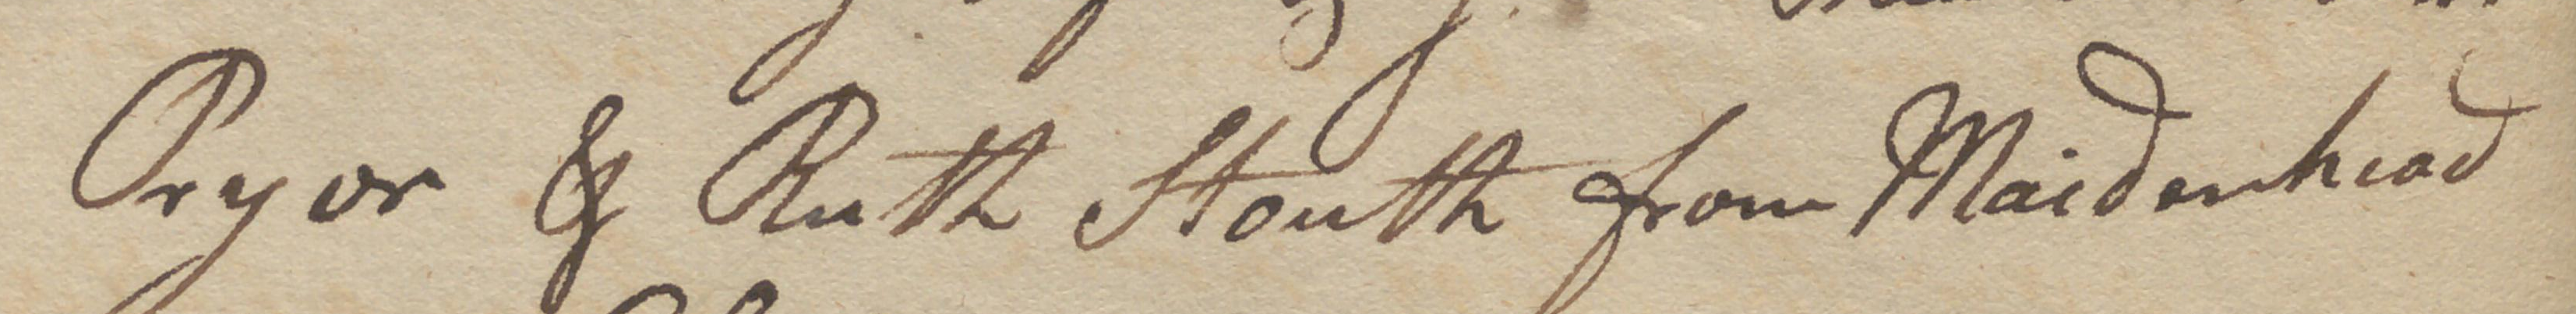Pryor & Ruth Stouth from Maidenhead
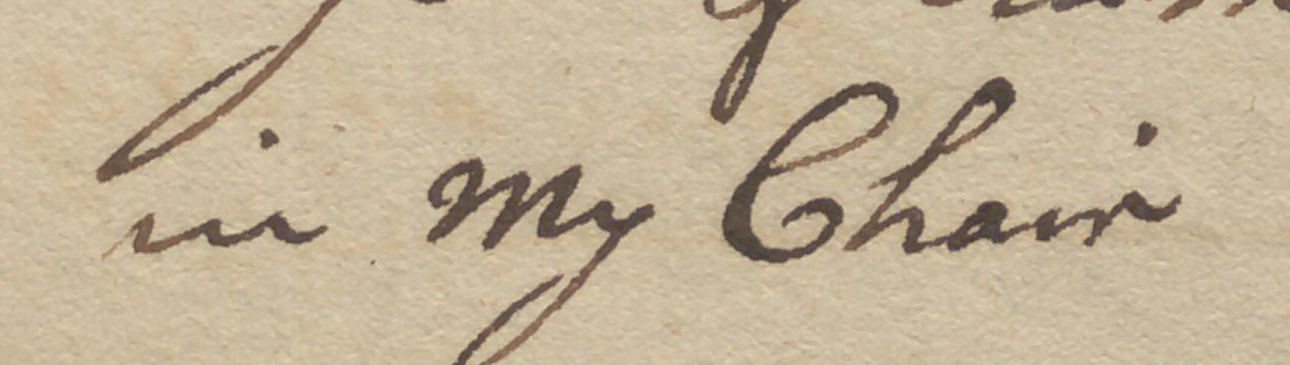in My Chair
